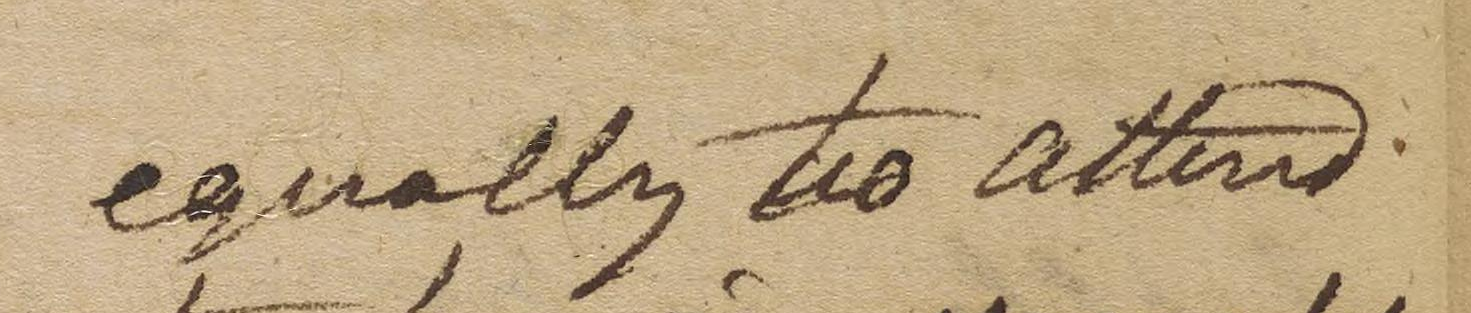equally to attend
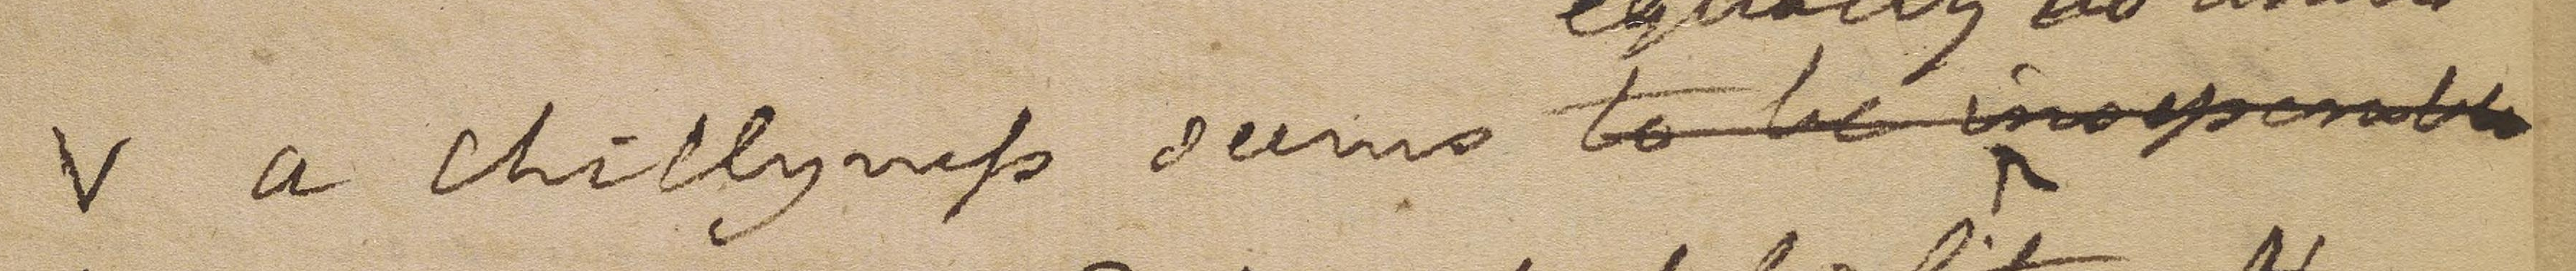V A chillyness seems [to be inseperable] ^
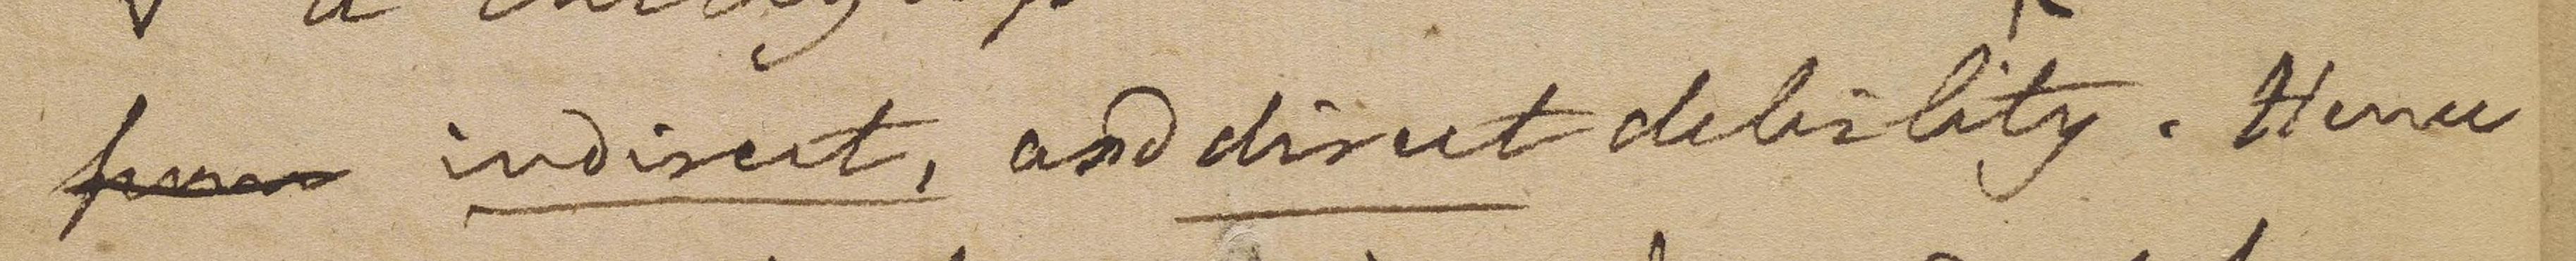[from] indirect, and direct debility. Hence
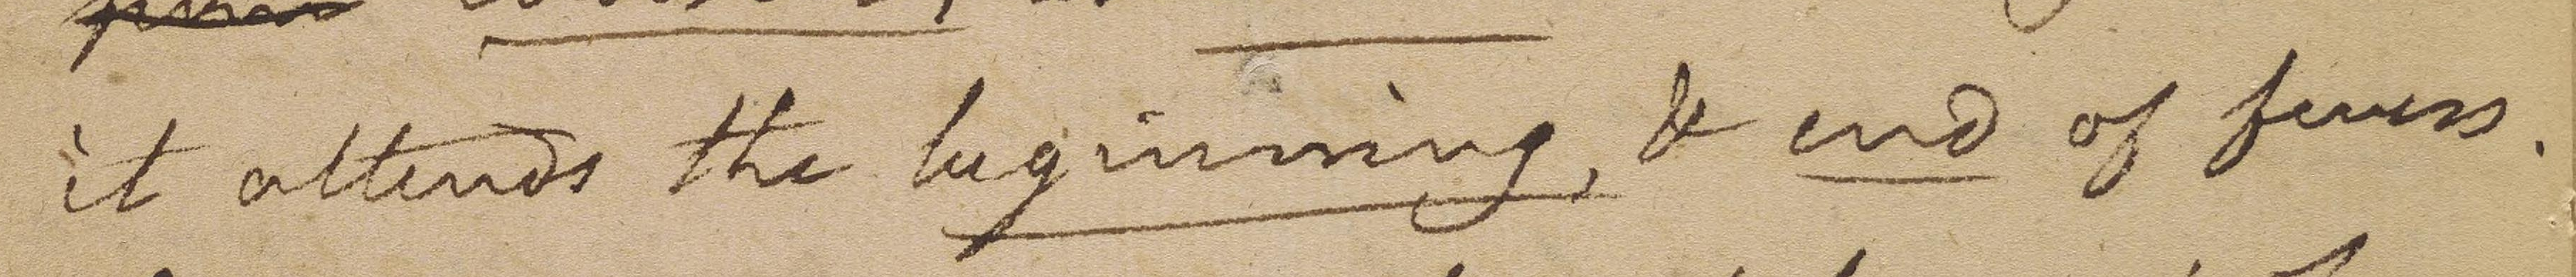it attends the beginning, & end of fevers.
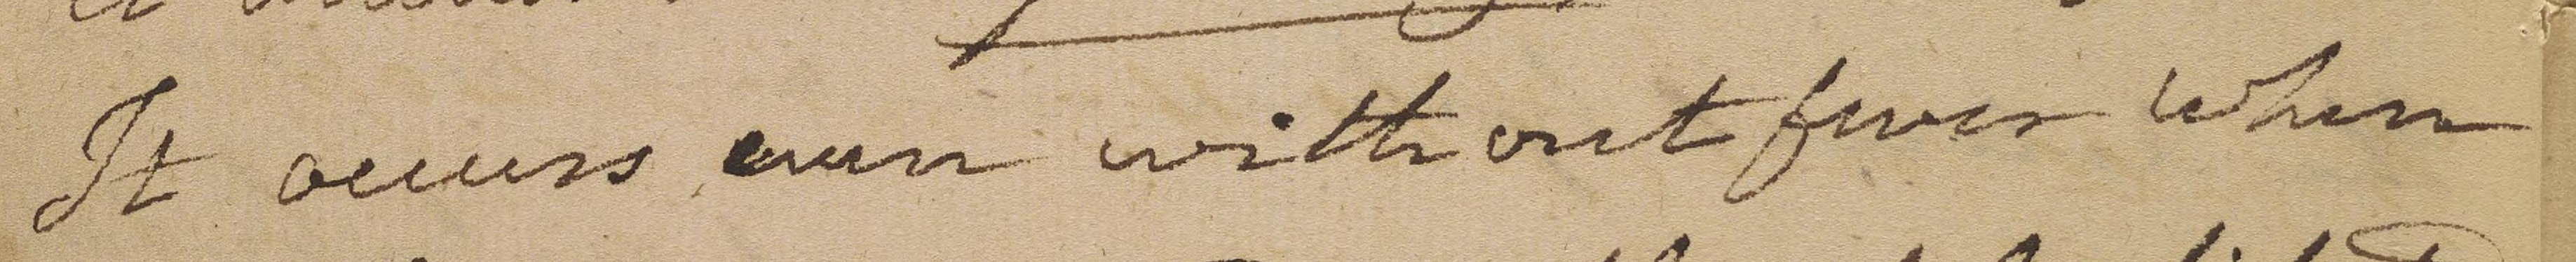It occurs even without fever when
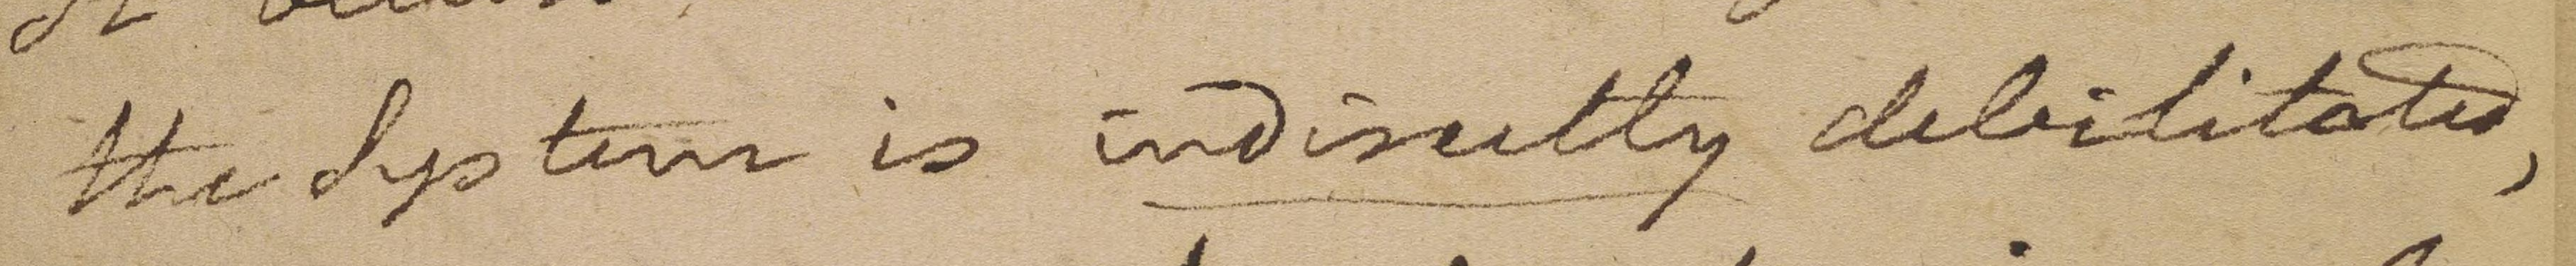the system is indirectly debilitated,
